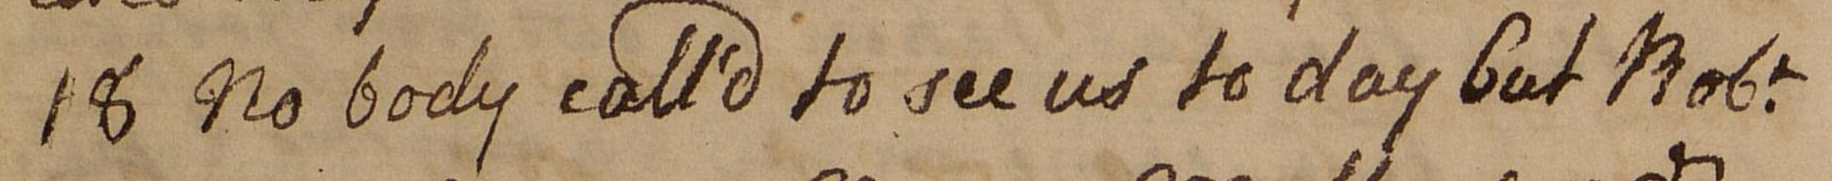18 No body call'd to see us to day but Rob^t.
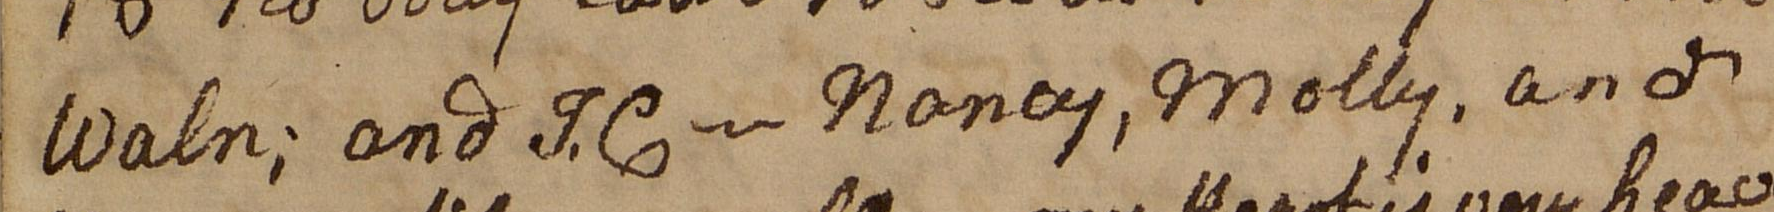Waln; and J.C- Nancy, Molly, and
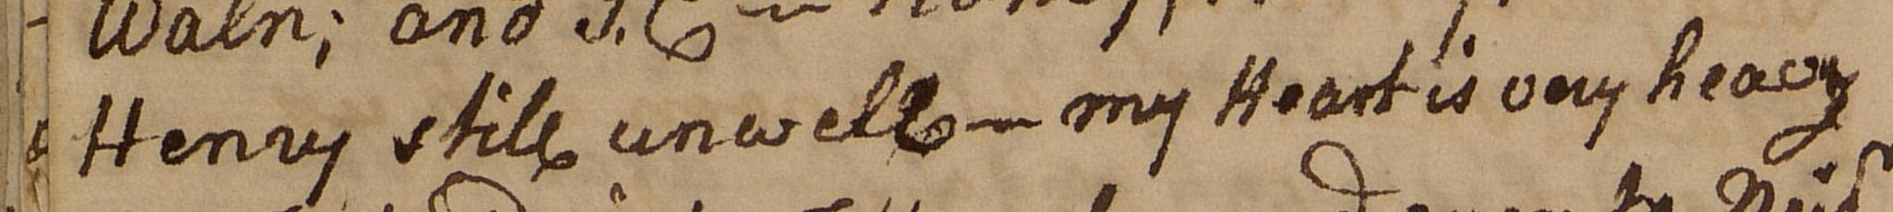Henry still unwell- my Heart is very heavy
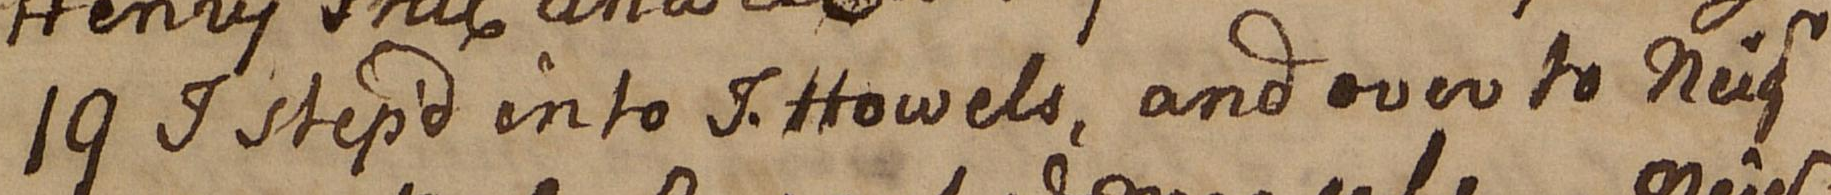19 I step'd into S. Howels, and over to Neigh^r
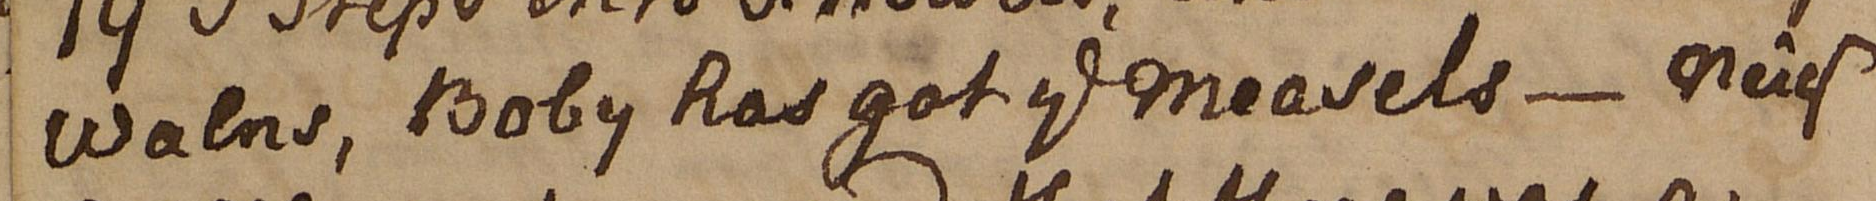Walns, Boby has got y^e measels- Neig^r
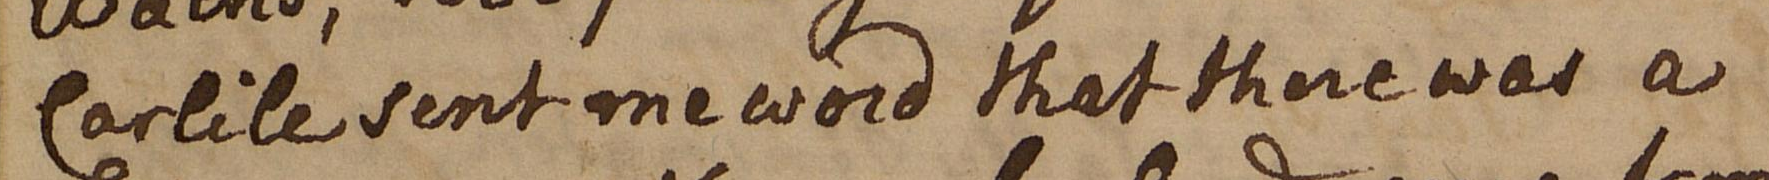Carlile sent me word that there was a
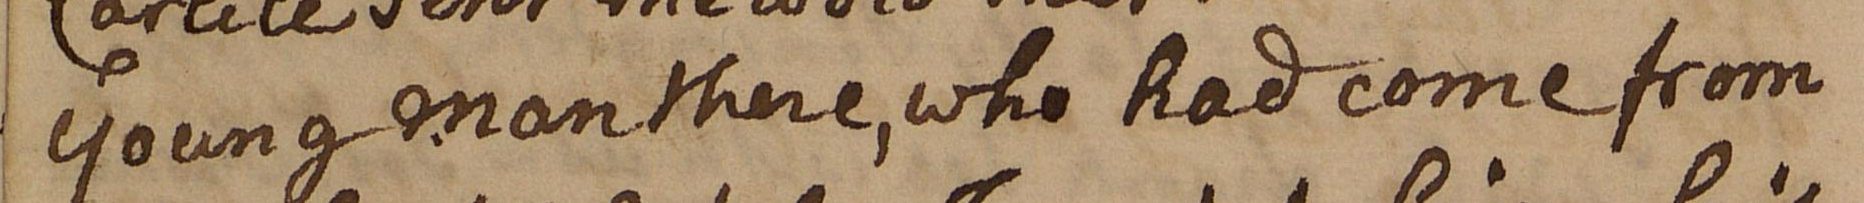young Man there, who had come from
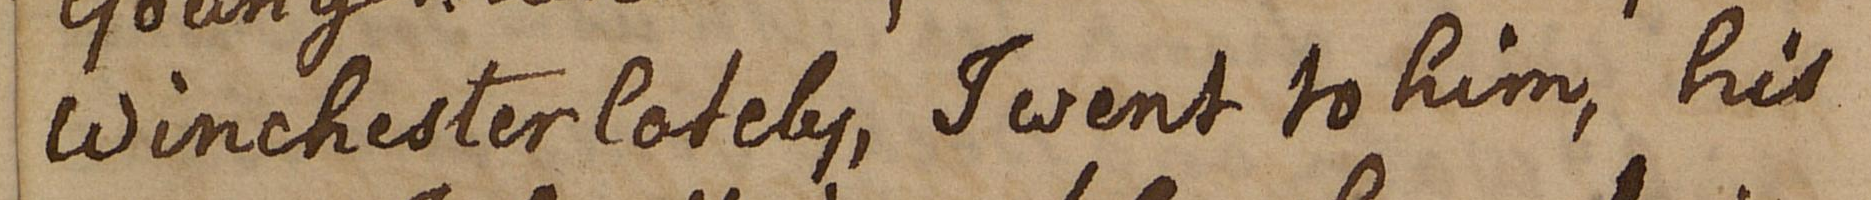Winchester lately, I went to him, his
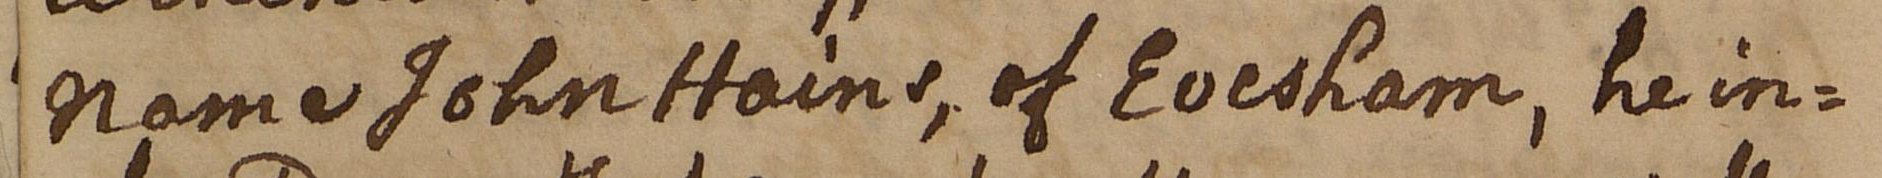Name John Hains, of Evesham, he in-
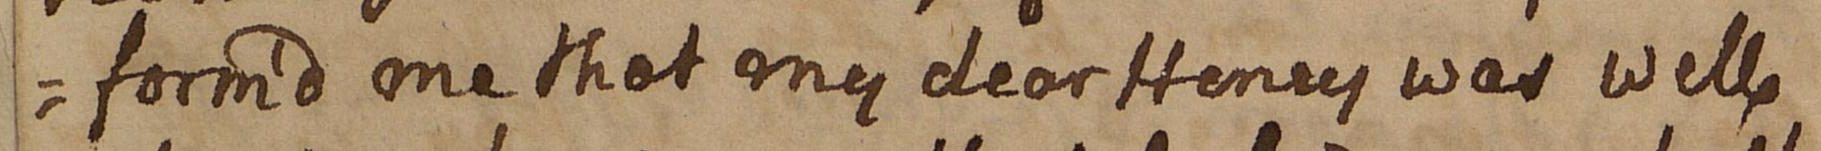-form'd me that my dear Henry was well
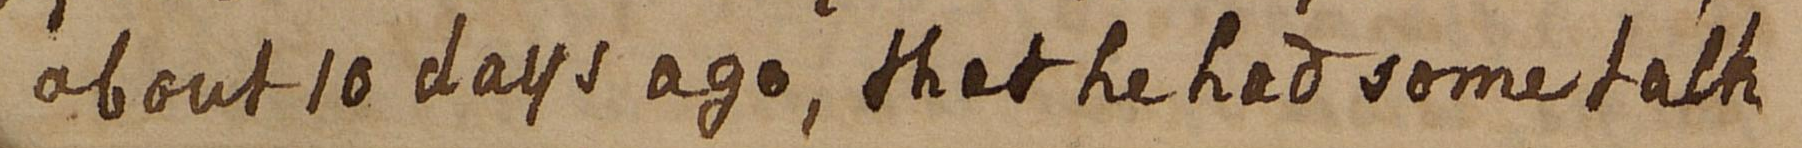about 10 days ago, that he had some talk
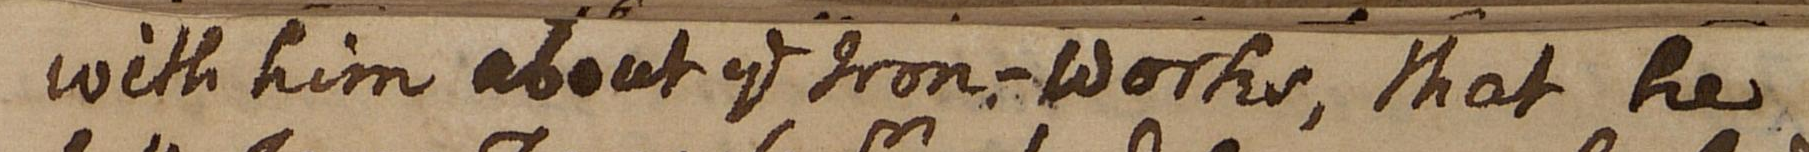with him about y^e Iron-Works, that he
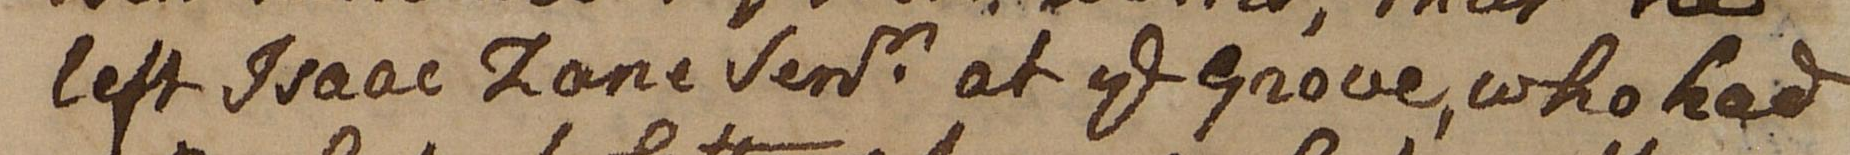left Isaac Zone Sen^r. at y^e Grove, who had
